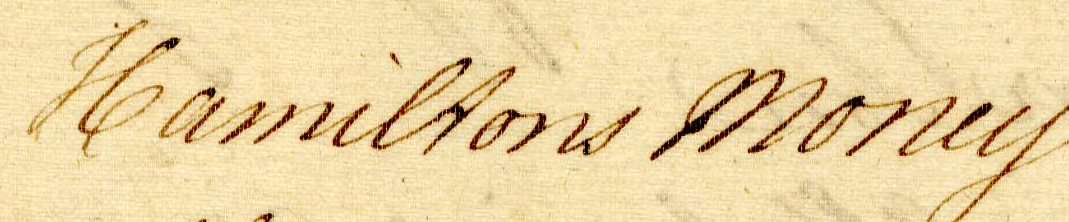Hamiltons Money
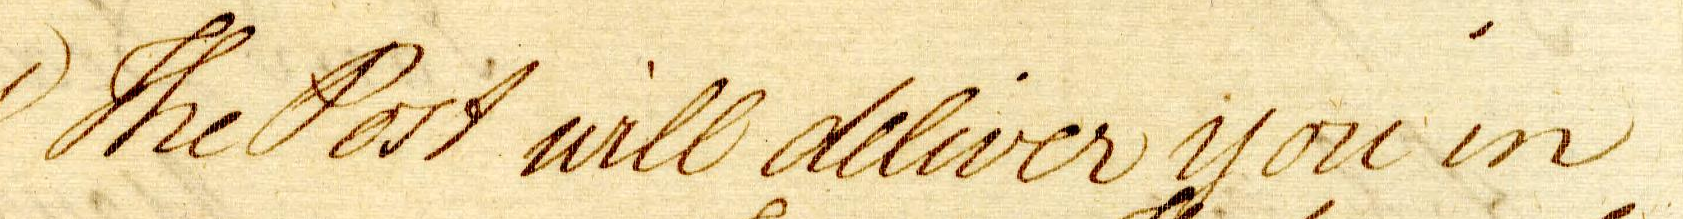The Post will deliver you in
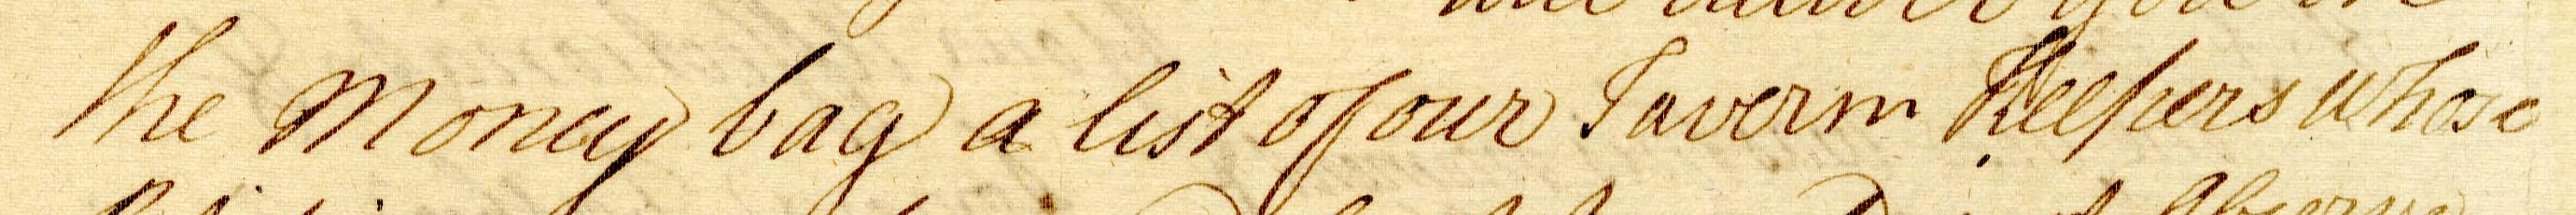the Money bag a list of our Tavern Keepers whose
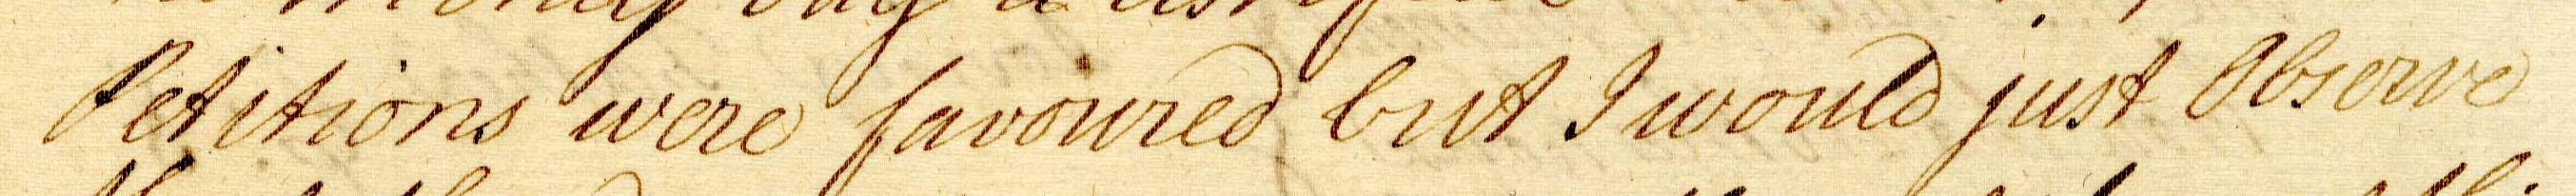Petitions were favoured but I would just Observe
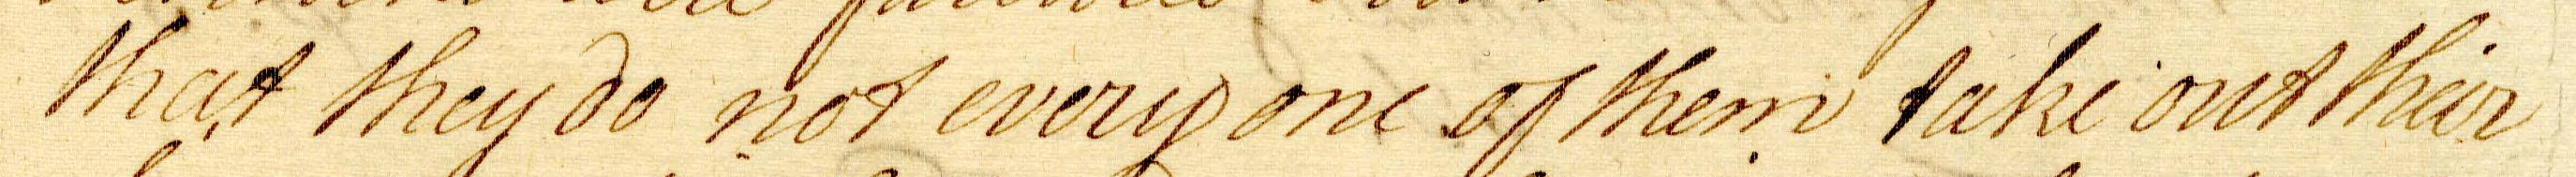that they do not every one of them take out their
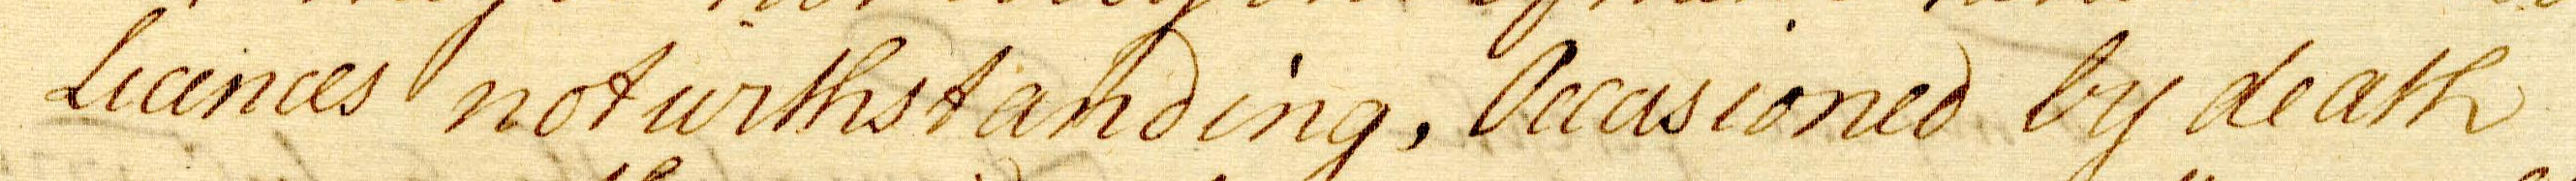Licences not withstanding, Occasioned by death
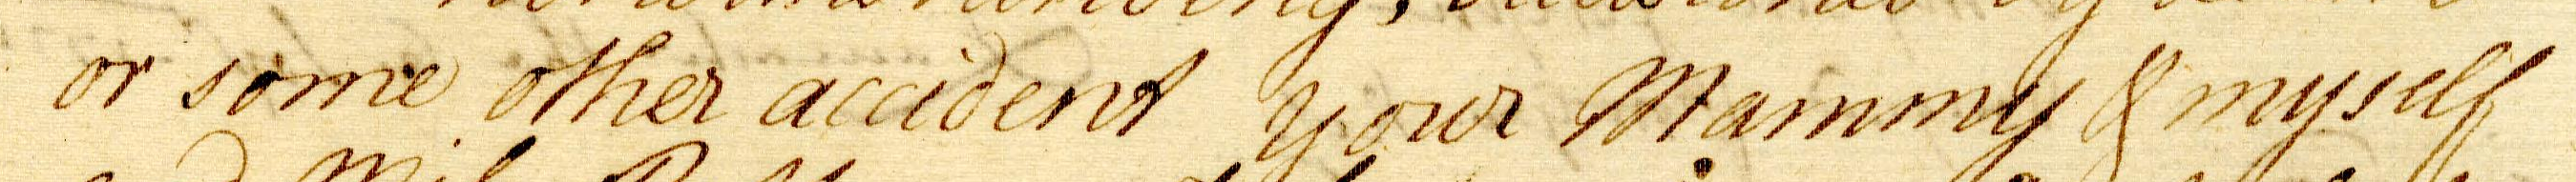or some other accident your Mammy & myself
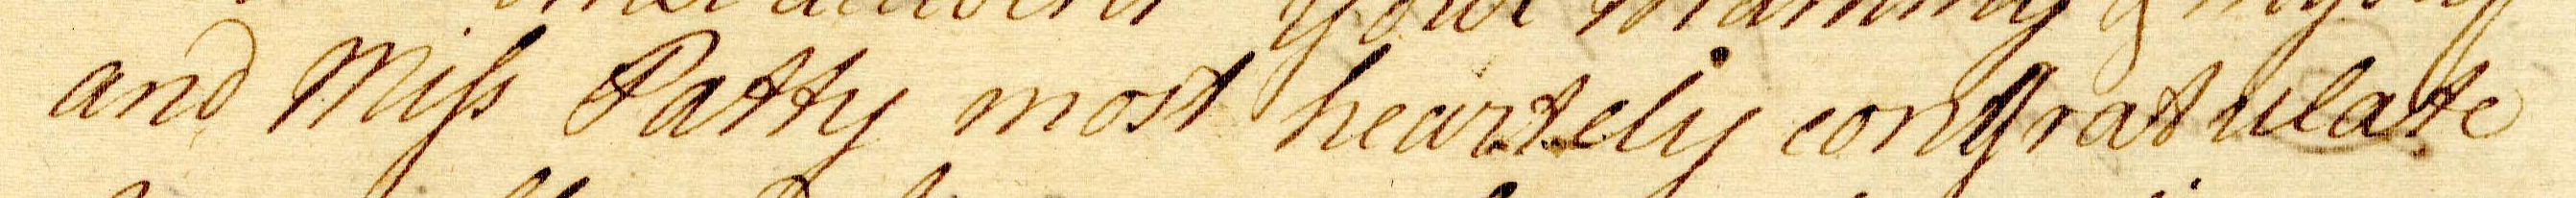and Miss Patty most heartely congratulate
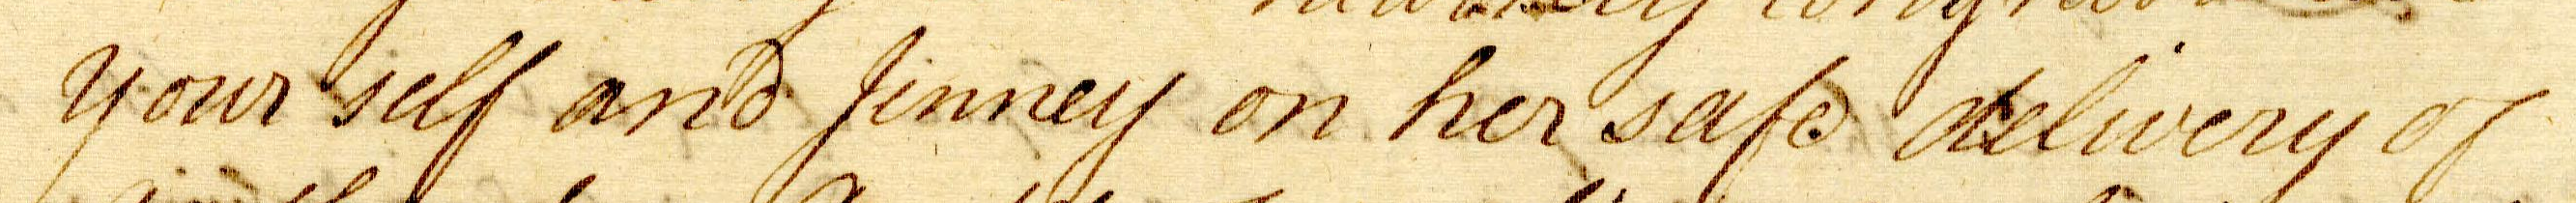Your self and Jenney on her safe delivery of
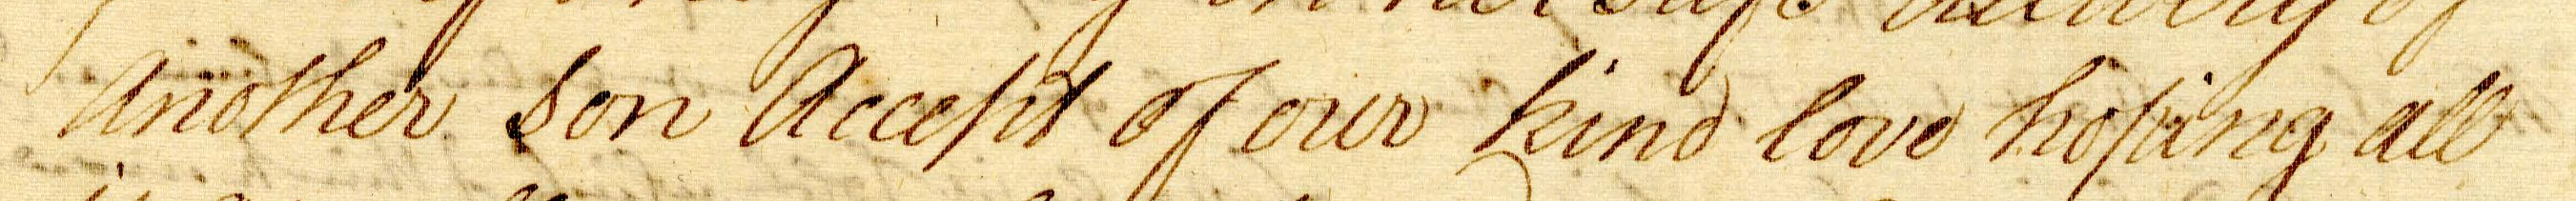Another Son Accept of our kind love hoping all
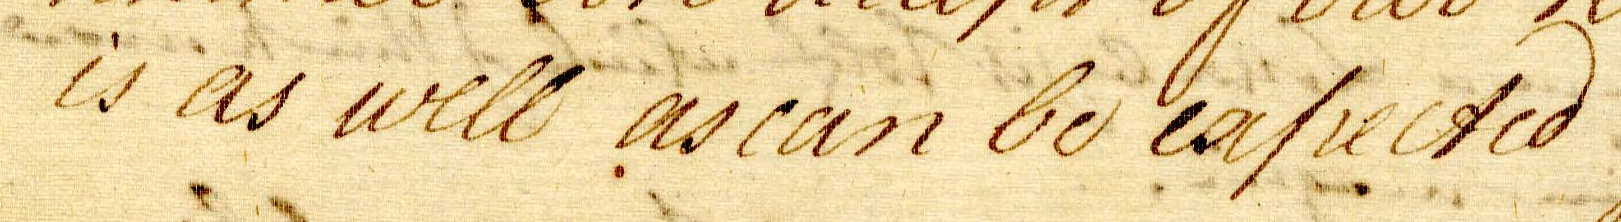is as well as can be expected
